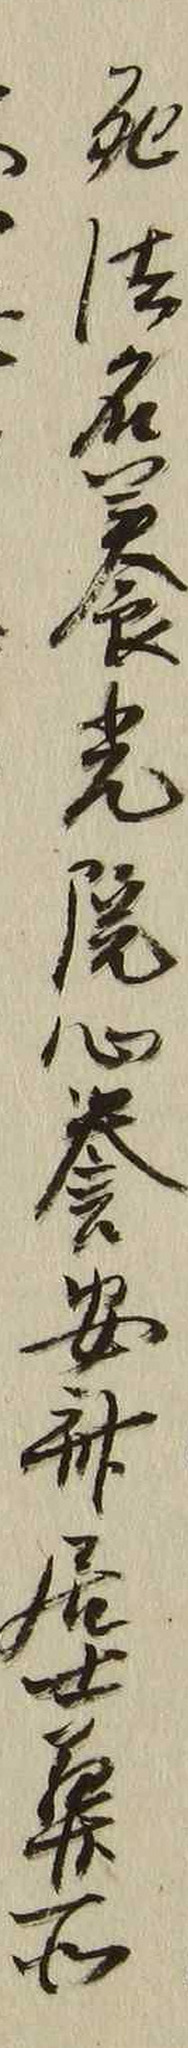死法名養光院心誉安斎居士葬所
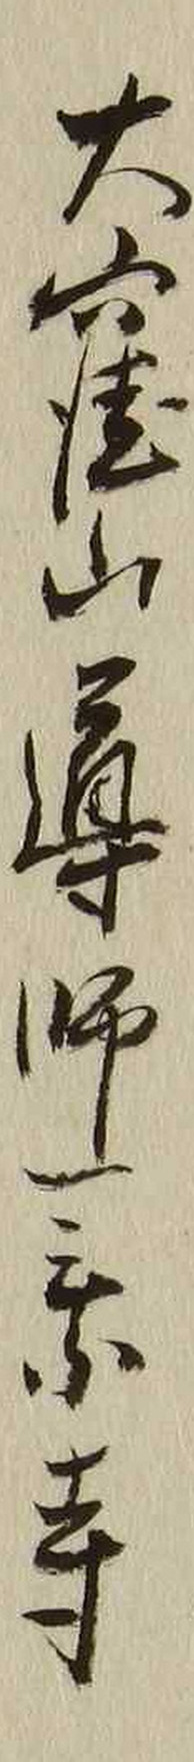大窪山導師一乗寺
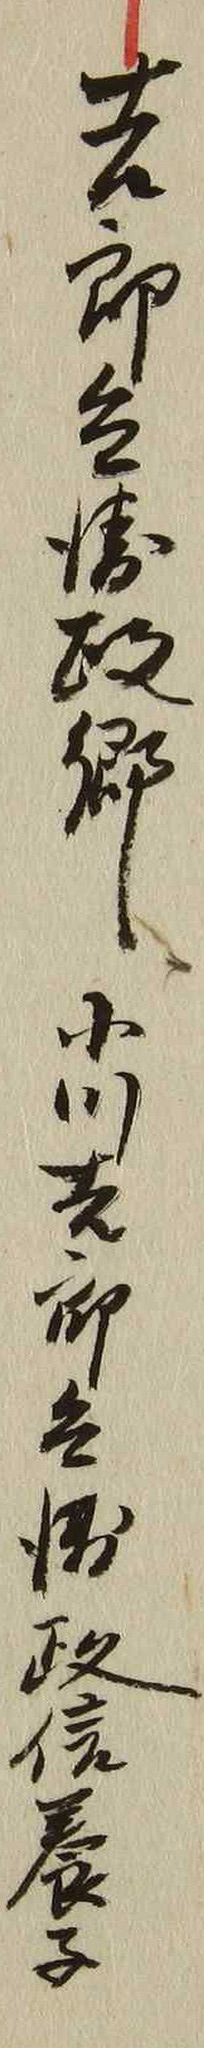吉郎兵衛政郷小川吉郎兵衛政信養子
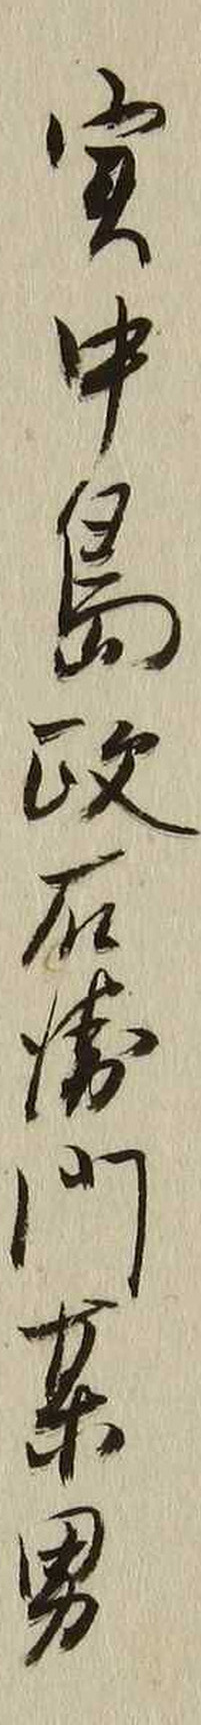実中島政右衛門某男
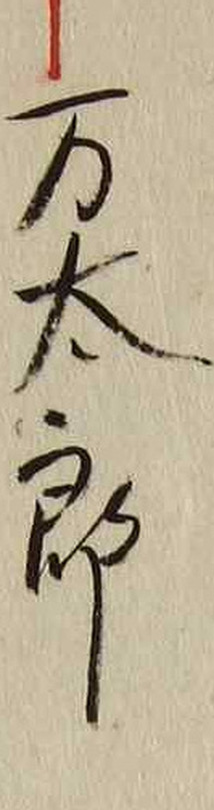万太郎
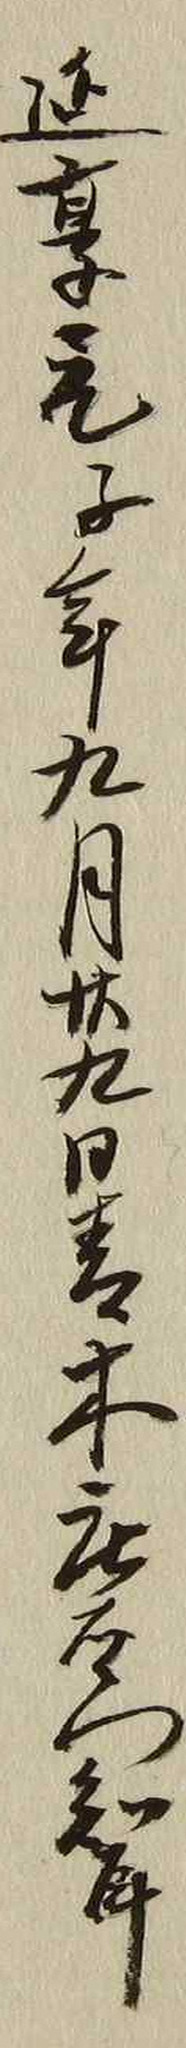延享元子年九月廿九日青木庄右衛門婿
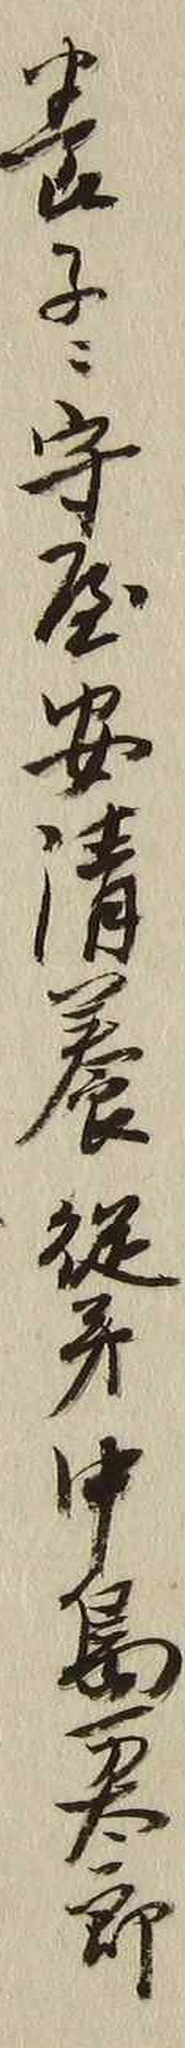養子ニ守屋安清養従弟中島万太郎
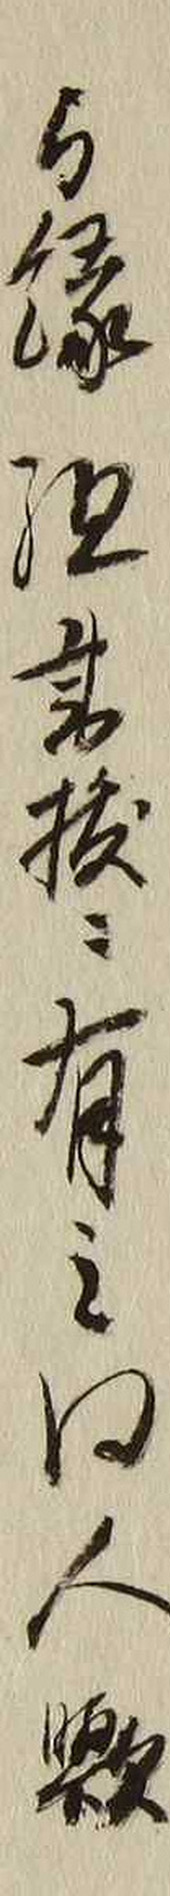与縁組書抜ニ有之同人歟
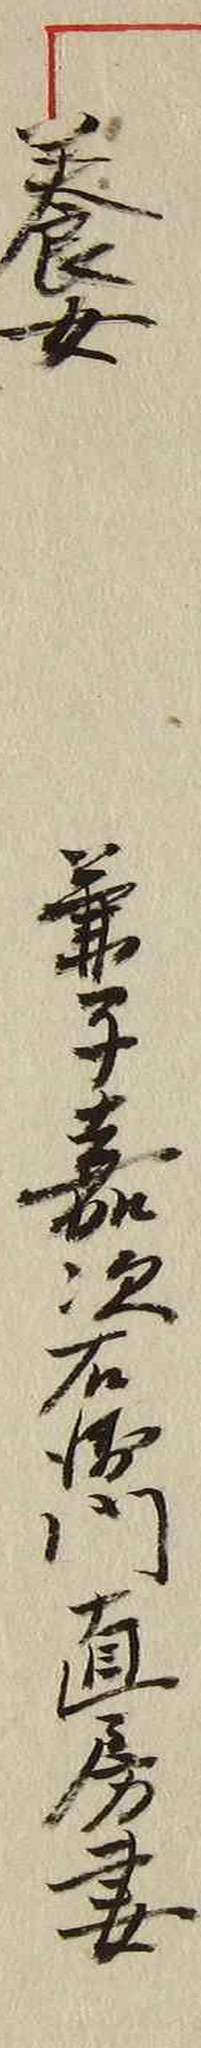養女兼子嘉次右衛門直房妻
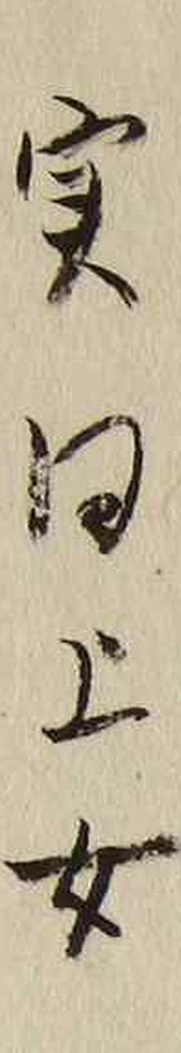実同上女

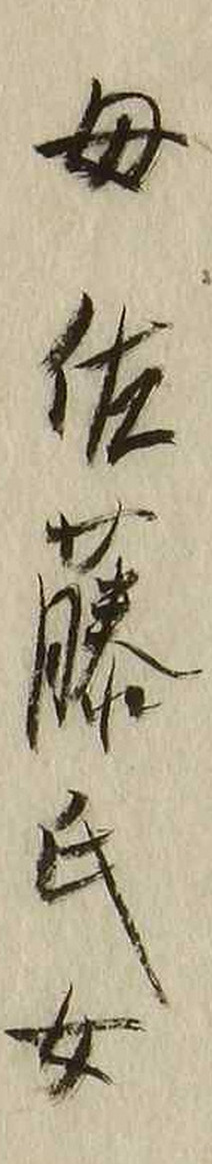母佐藤氏女
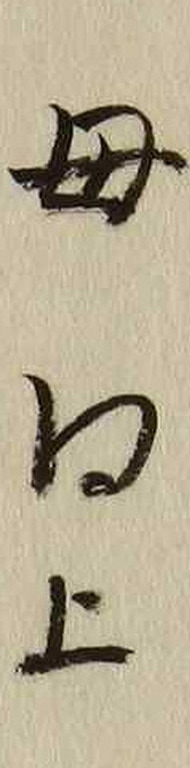母同上
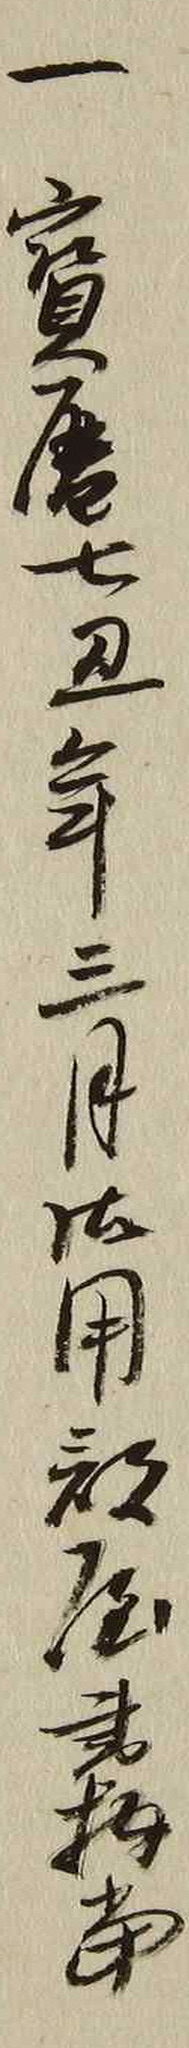一宝暦七丑年三月御用部屋書物当
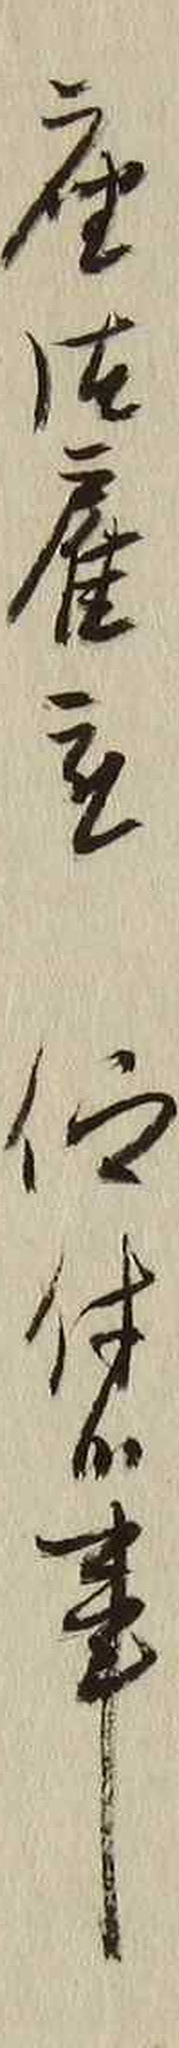座御雇被仰付候事
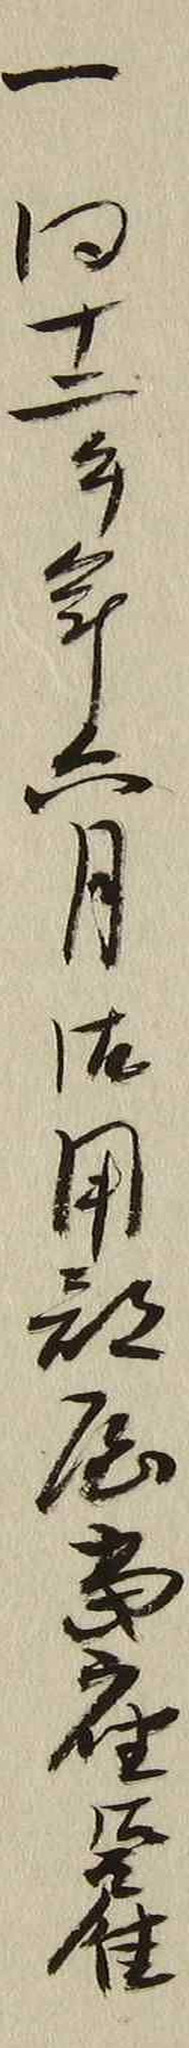一同十二午年六月御用部屋当座御雇
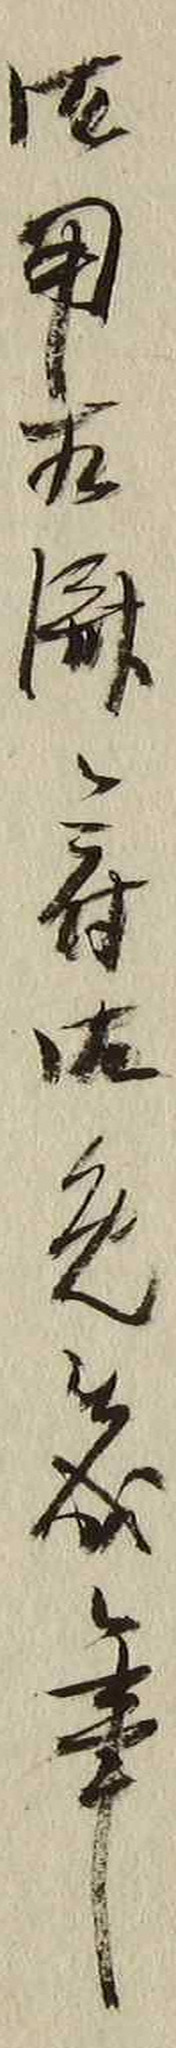御用相済候ニ付御免被成候事
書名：諸士系譜　巻之349　も之部5
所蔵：会津若松市立会津図書館
